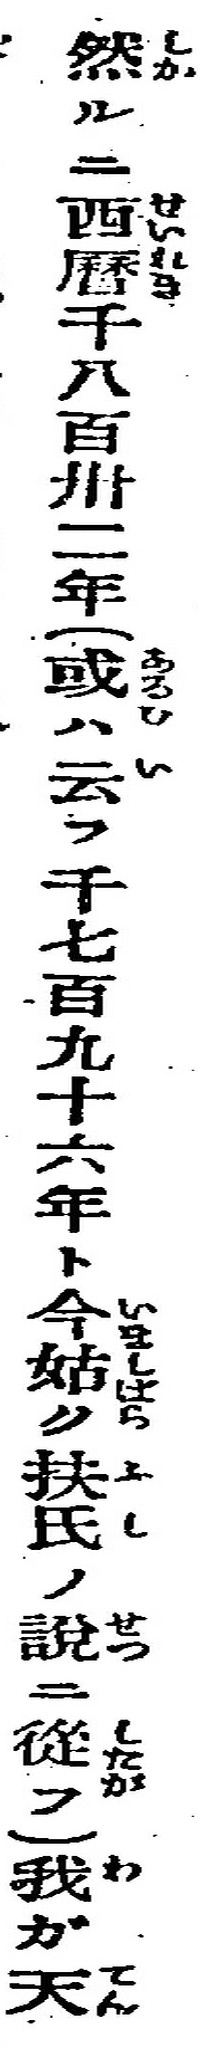然ルニ西暦千八百卅二年(或ハ云フ千七百九十六年ト今姑ク扶氏ノ説ニ従フ)我ガ天
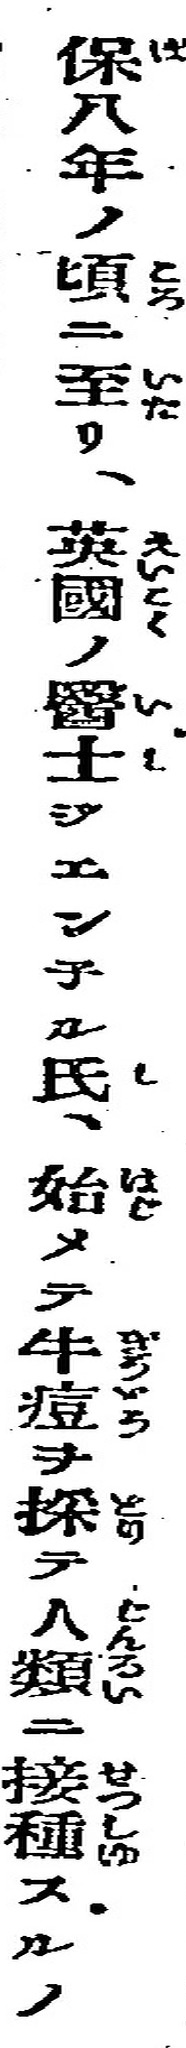保八年ノ頃ニ至リ、英国ノ医士ジエンネル氏、始メテ牛痘ヲ採テ人類ニ接種スルノ
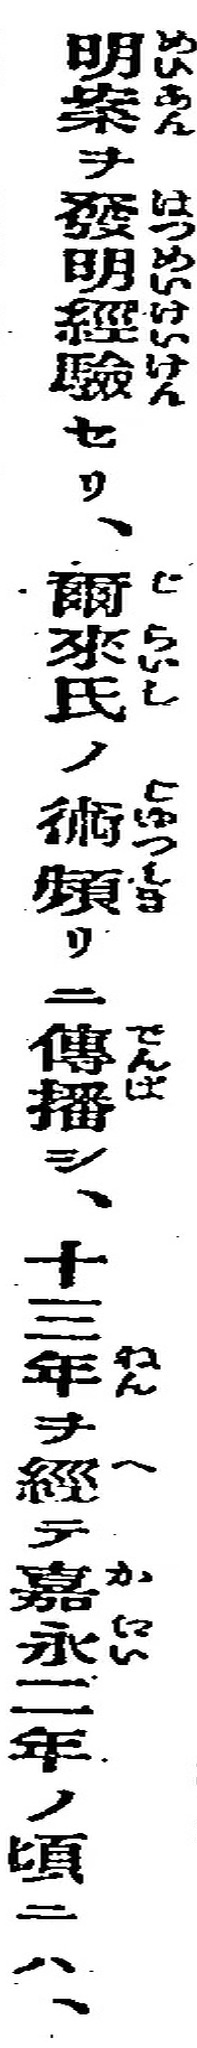明案ヲ発明経験セリ、爾来氏ノ術頻リニ伝播シ、十三年ヲ経テ嘉永ニ年ノ頃ニハ、
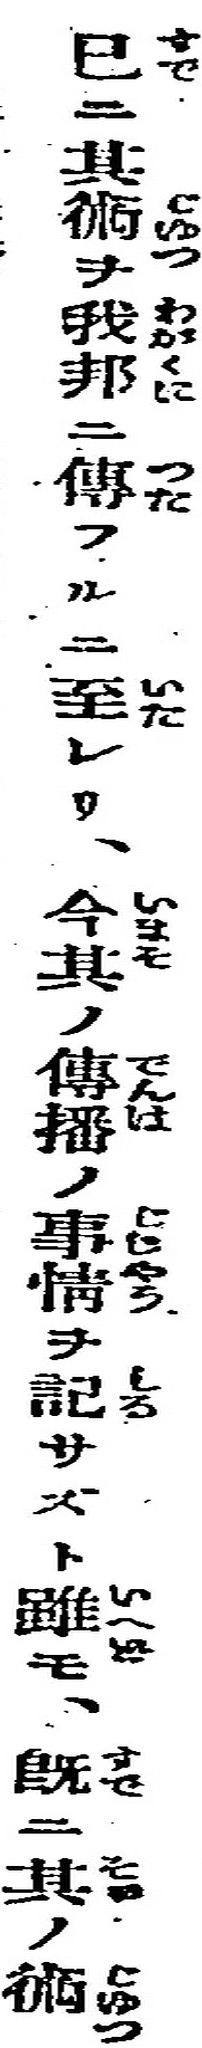已ニ其術ヲ我邦ニ伝フルニ至レリ、今其ノ伝播ノ事情ヲ記サズト雖モ、既ニ其ノ術
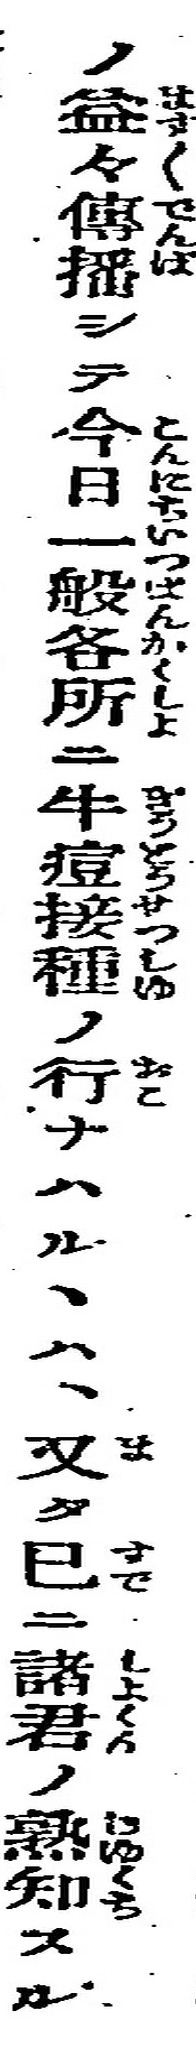ノ益々伝播シテ今日一般各所ニ牛痘接種ノ行ナハルヽハ、又タ已ニ諸君ノ熟知スル
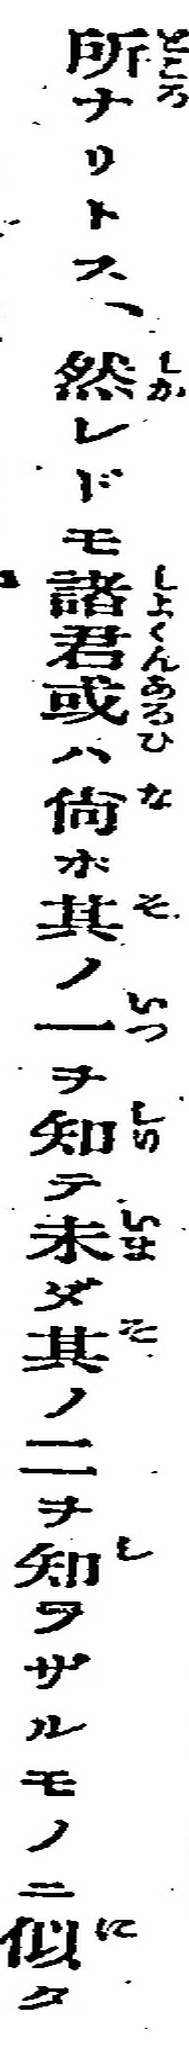所ナリトス、然レドモ諸君或ハ尚ホ其ノ一ヲ知テ未ダ其ノ二ヲ知ラザルモノニ似タ
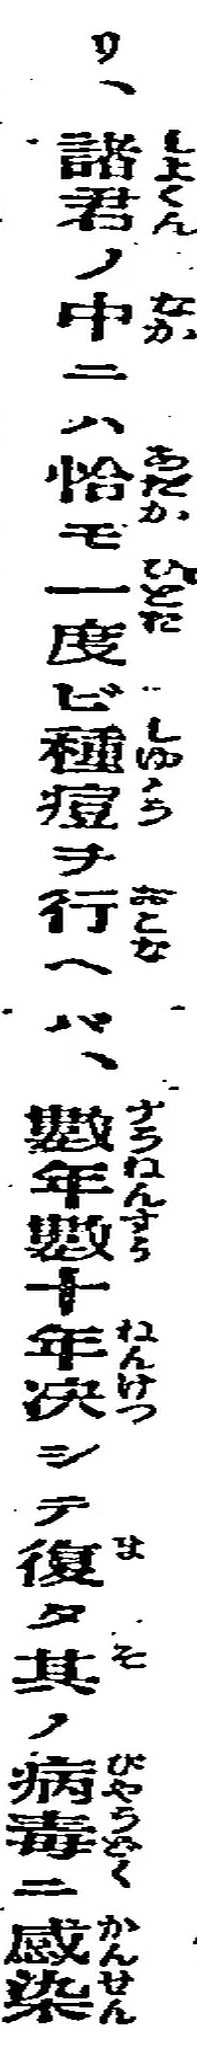リ、諸君ノ中ニハ恰モ一度ビ種痘ヲ行ヘバ、数年数十年决シテ復タ其ノ病毒ニ感染
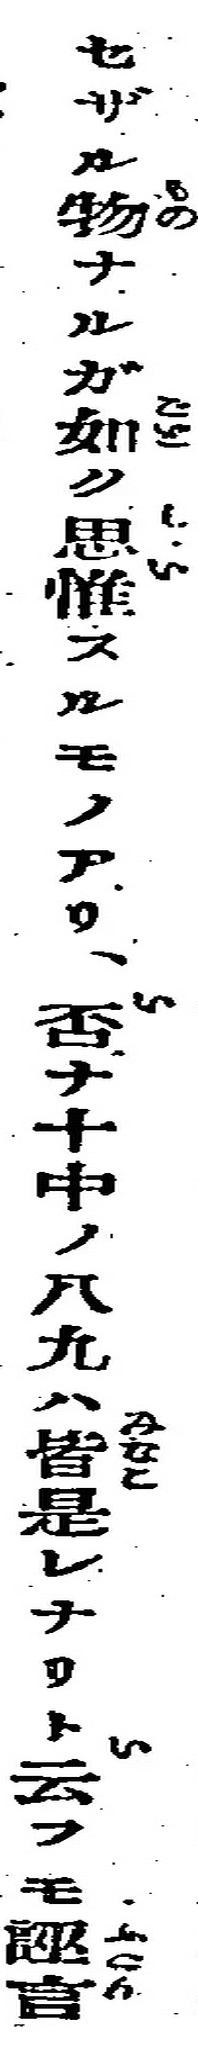セザル物ナルガ如ク思惟スルモノアリ、否ナ十中ノ八九ハ皆是レナリト云フモ誣言
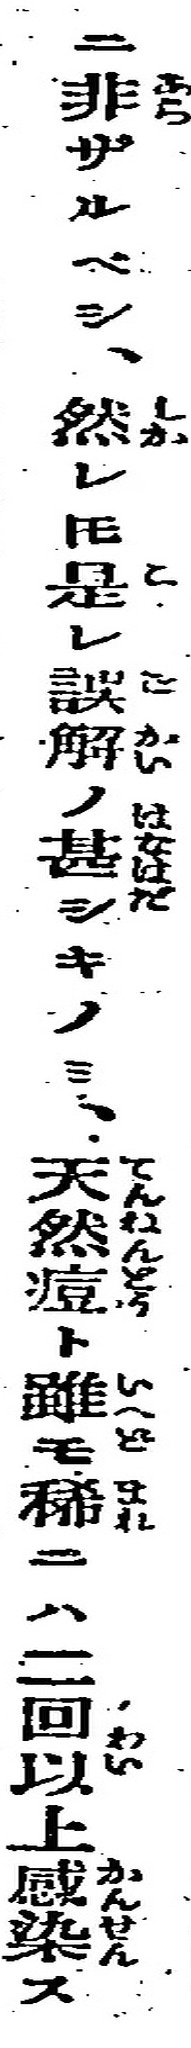ニ非ザルベシ、然レ𪜈是レ誤解ノ甚シキノミ、天然痘ト雖モ稀ニハ二回以上感染ス
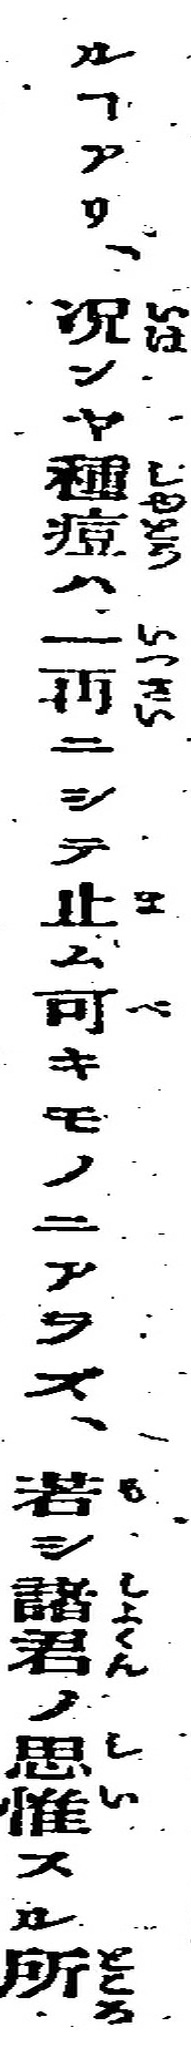ルヿアリ、况ンヤ種痘ハ一再ニシテ止ム可キモノニアラズ、若シ諸君ノ思惟スル所

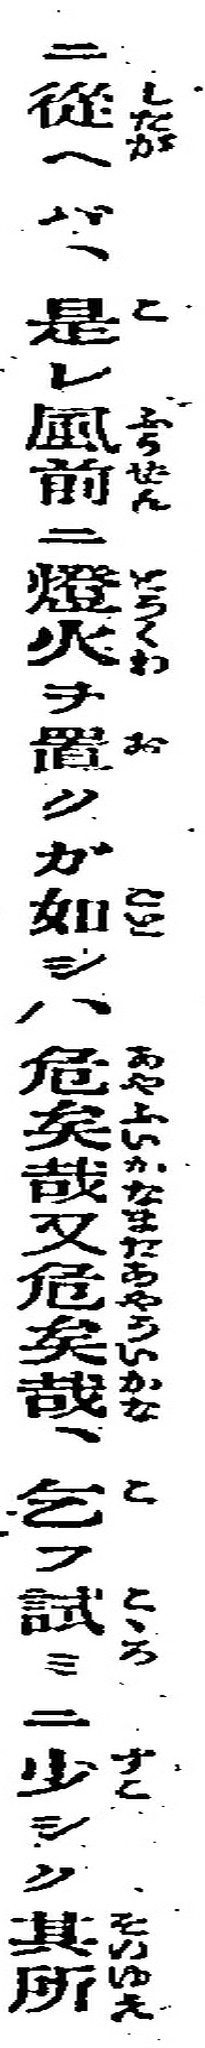ニ従ヘバ、是レ風前ニ灯火ヲ置クガ如シ、危矣哉又危矣哉、乞フ試ミニ少シク其所
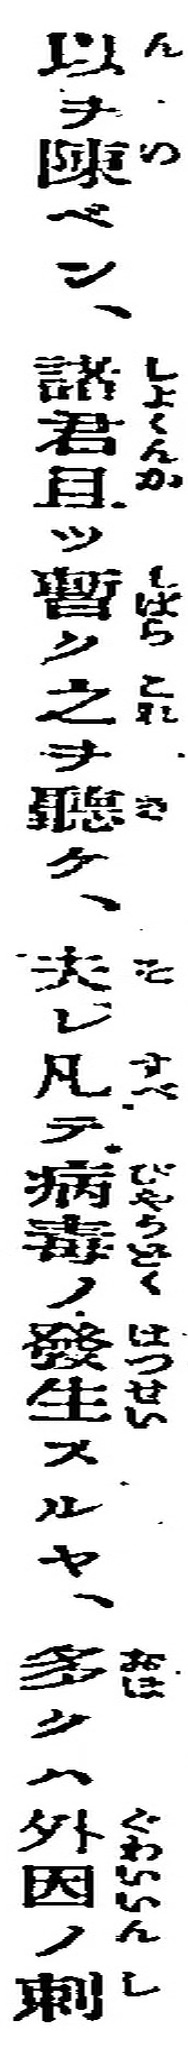以ヲ陳ベン、諸君且ツ暫ク之ヲ聴ケ、夫レ凡テ病毒ノ発生スルヤ、多クハ外因ノ刺
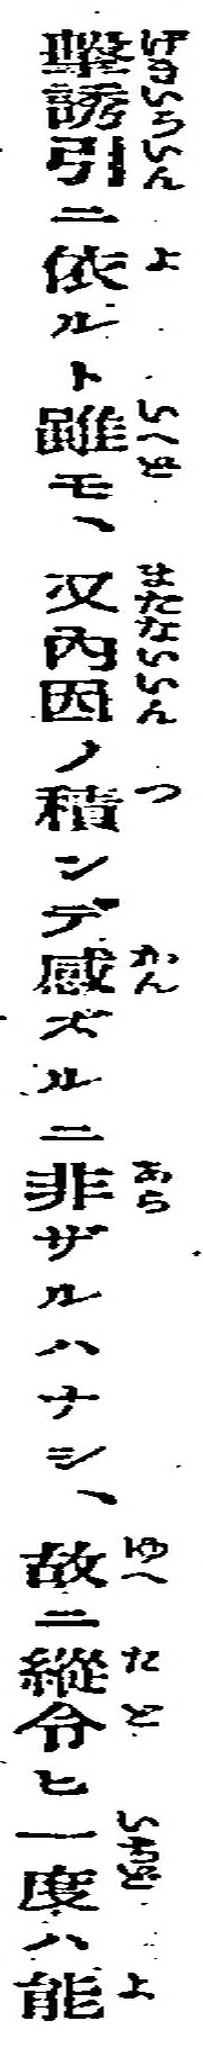擊誘引ニ依ルト雖モ、又内因ノ積ンデ感ズルニ非ザルハナシ、故ニ縱令ヒ一度ハ能
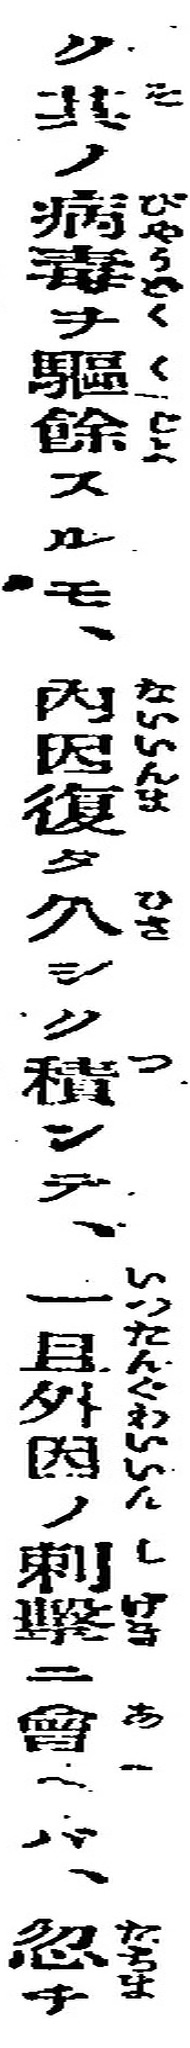ク其ノ病毒ヲ駆余スルモ、内因復タ久シク積ンデ、一旦外因ノ刺擊に会ヘバ、忽チ
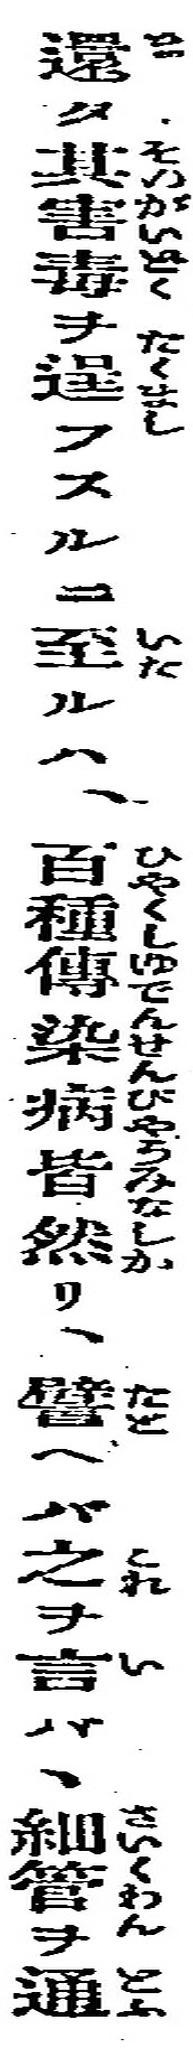還タ其害毒ヲ逞フスルニ至ルハ、百種伝染病皆然リ、譬へバ之ヲ言バヽ細管ヲ通
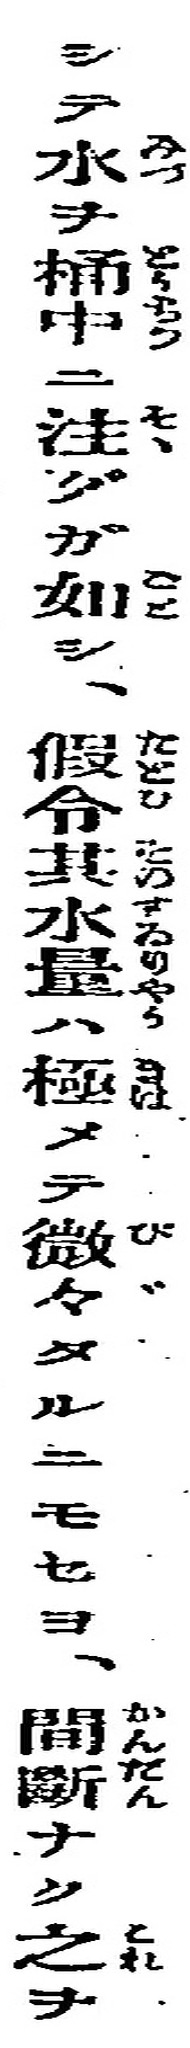シテ水ヲ桶中ニ注グガ如シ、仮令其水量ハ極メテ微々タルニモセヨ、間断ナク之ヲ
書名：天然痘予防注意兼種痘者之注意
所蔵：国立国会図書館 National Diet Library, JAPAN
